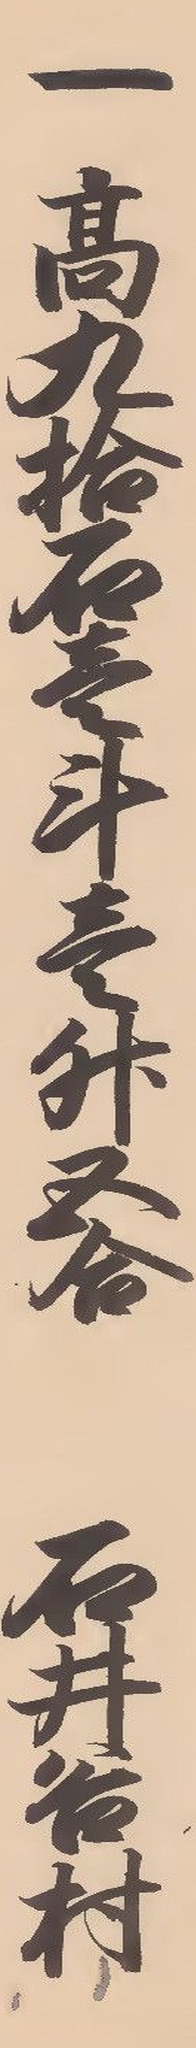一高九拾石壱斗壱升五合石井谷村
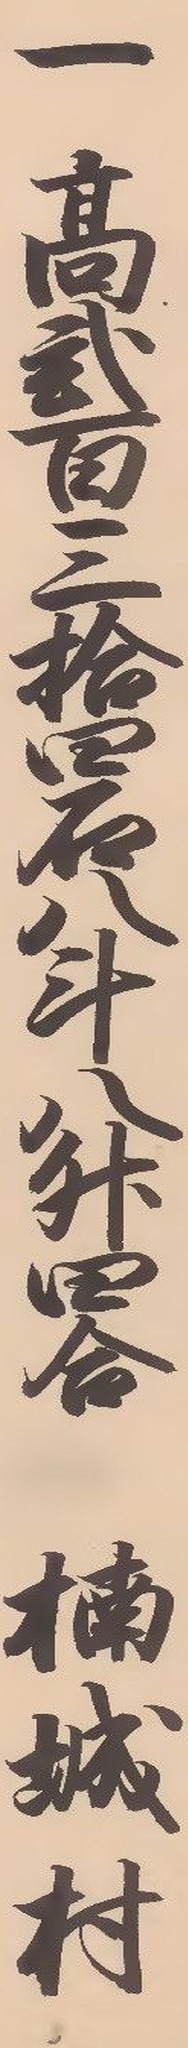一高弐百三拾四石八斗八升四合楠城村
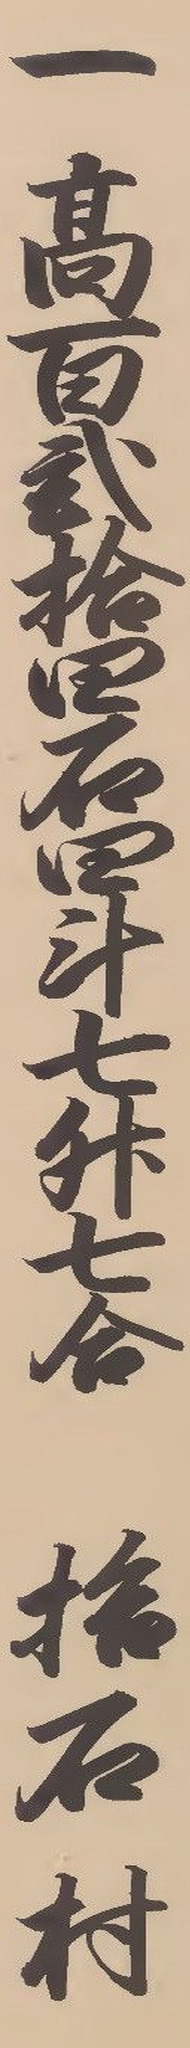一高百弐拾四石四斗七升七合拾石村
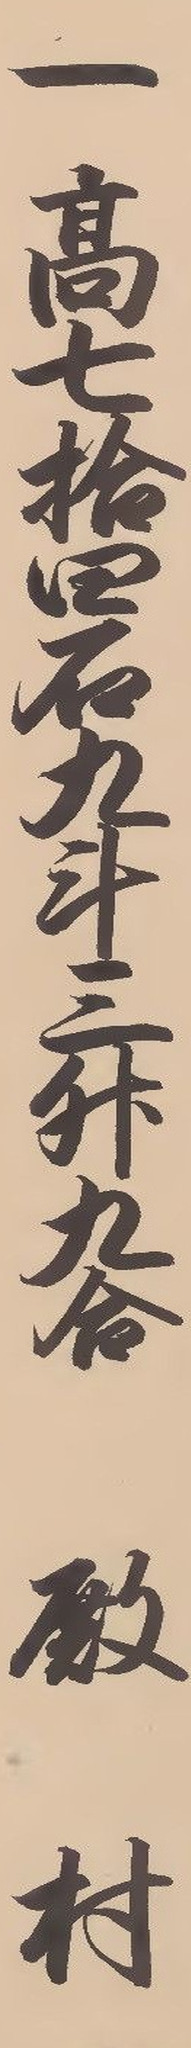一高七拾四石九斗三升九合殿村
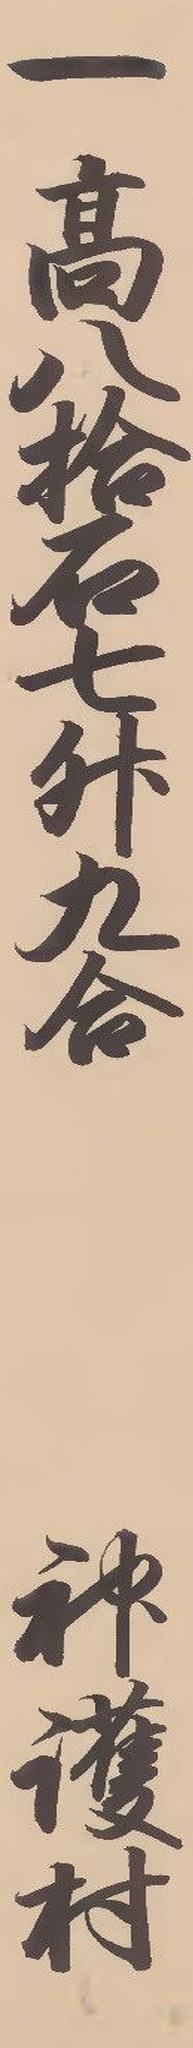一高八拾石七升九合神護村
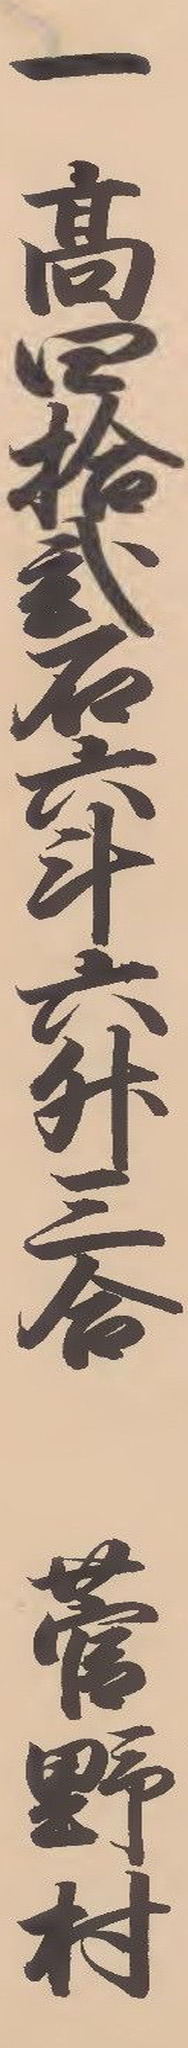一高四拾弐石六斗六升三合菅野村

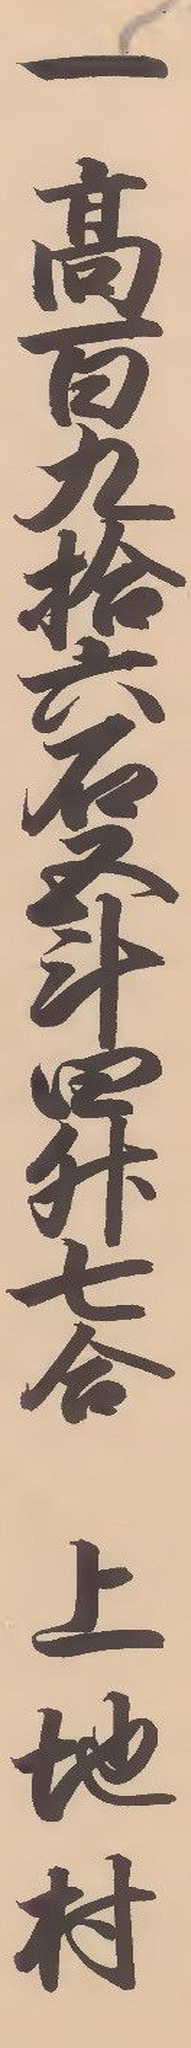一高百九拾六石五斗四升七合上地村
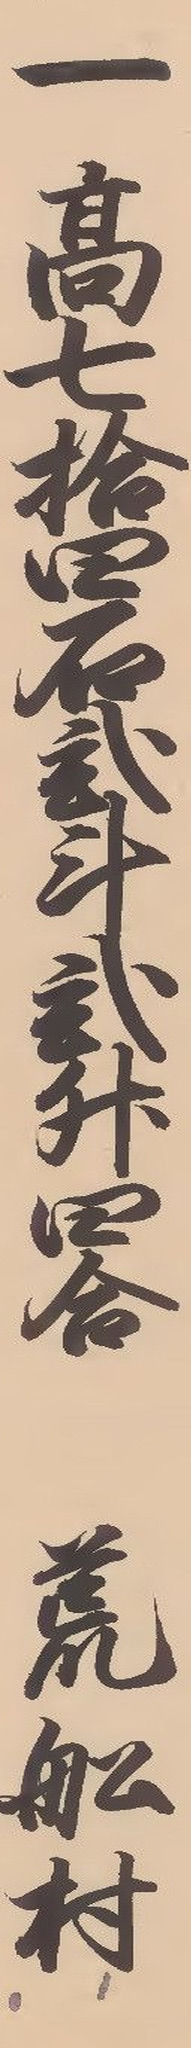一高七拾四石弐斗弐升四合荒船村
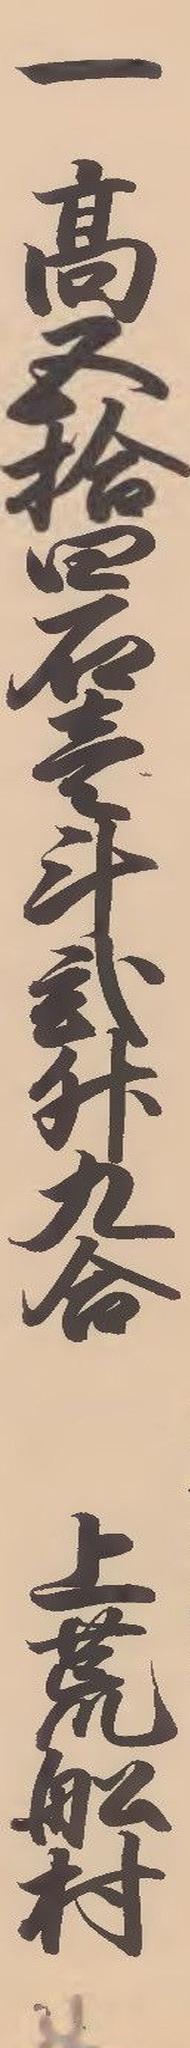一高七拾四石弐斗弐升四合荒船村
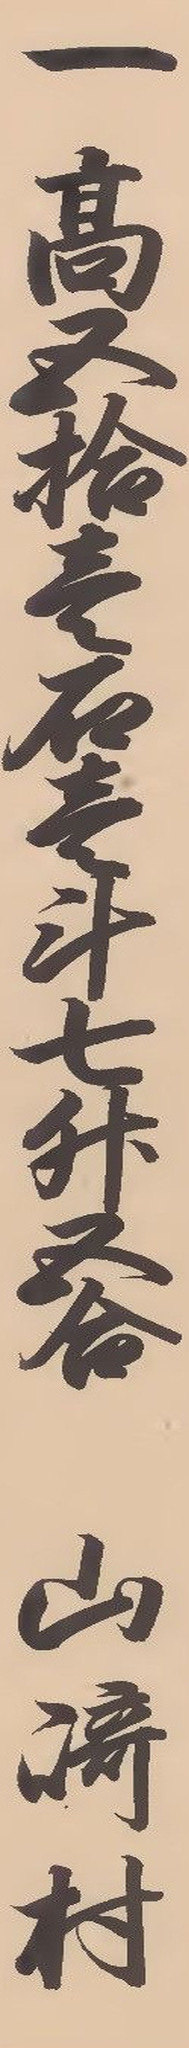一高五拾壱石壱斗七升五合山崎村
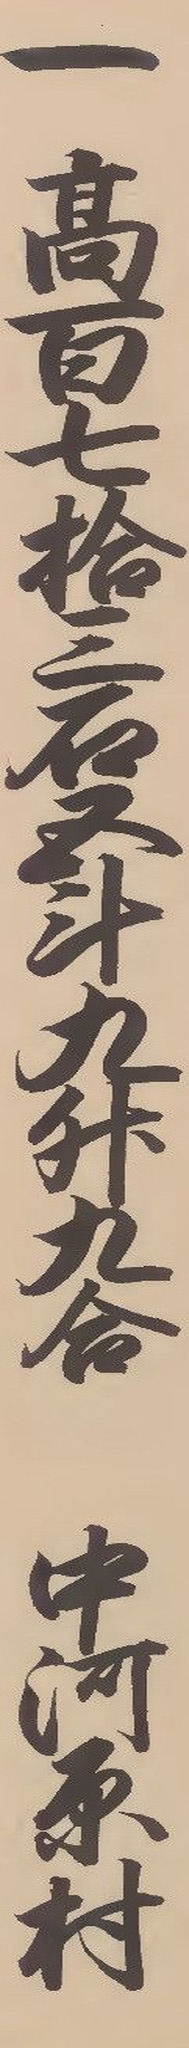一高百七拾三石五斗九升九合中河原村
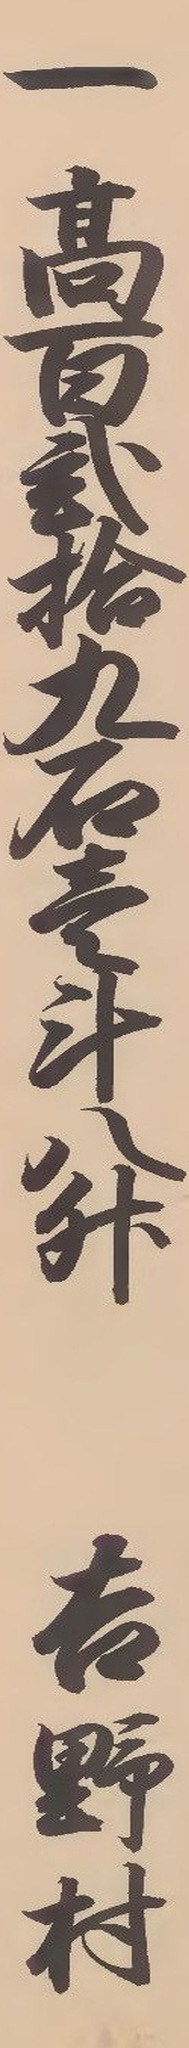一高百弐拾九石壱斗八升吉野村
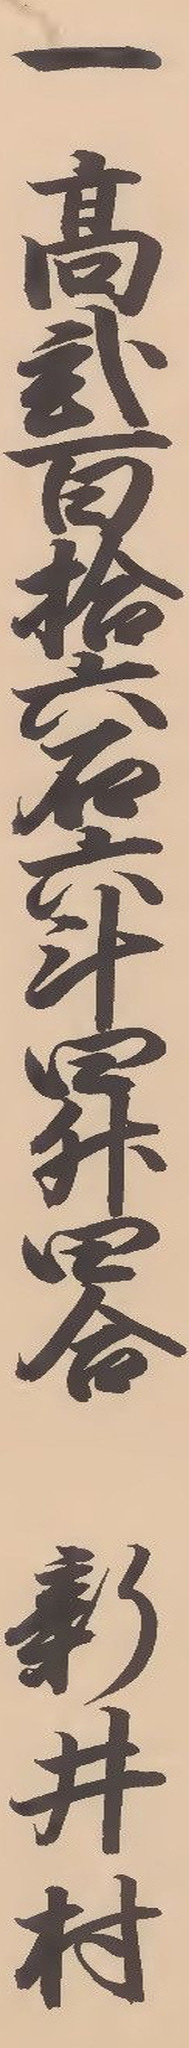一高弐百拾六石六斗四升四合新井村

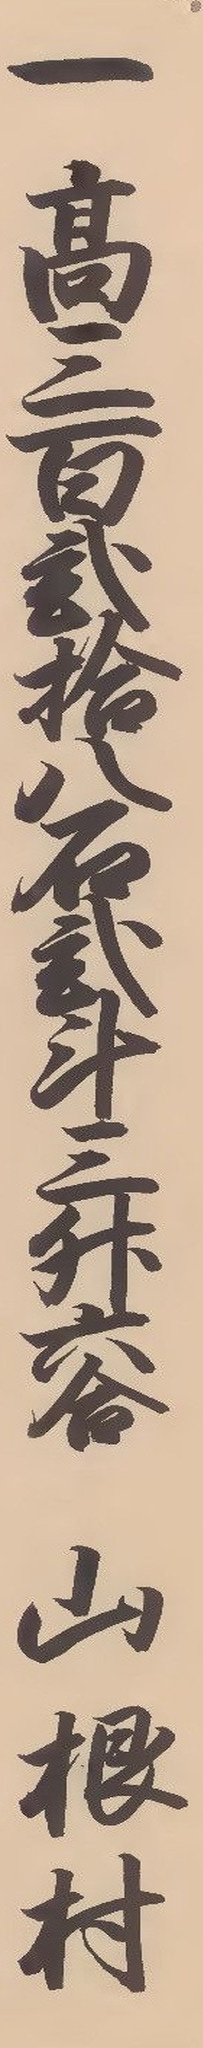一高三百弐拾八石弐斗三升六合山根村
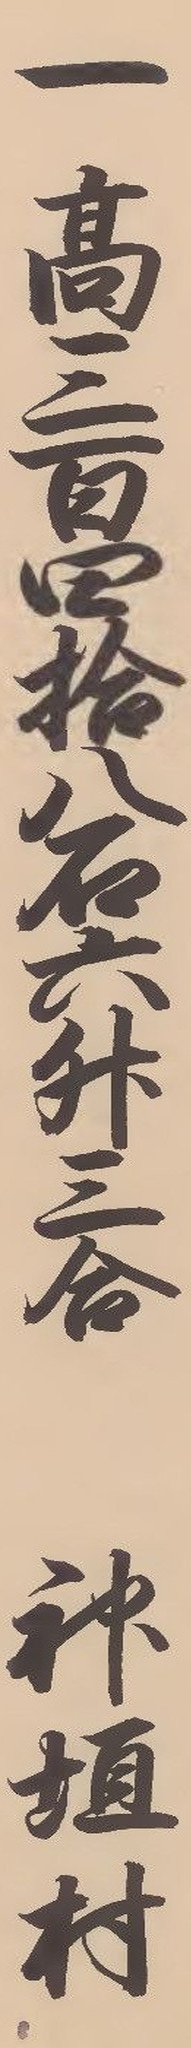一高三百四拾八石六升三合神垣村
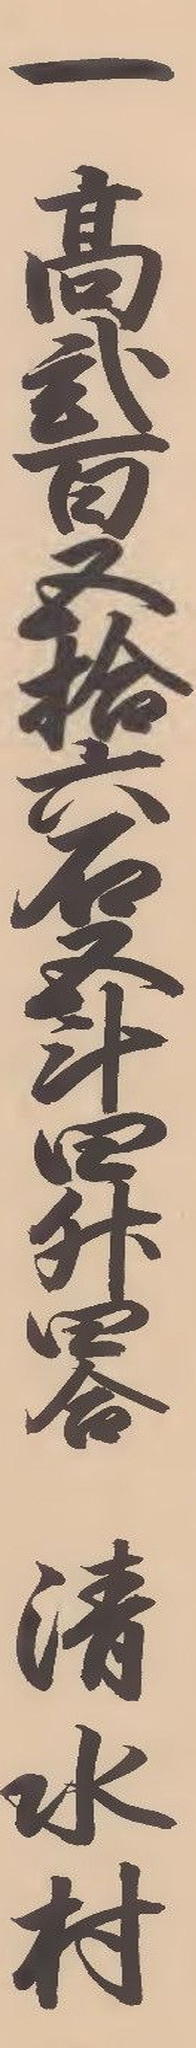一高弐百五拾六石五斗四升四合清水村
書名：因幡国郷帳
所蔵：国立公文書館 National Archives of Japan
